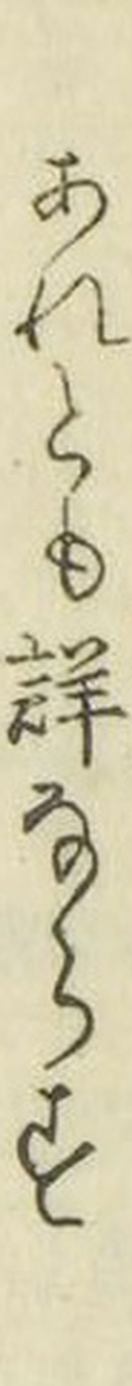あれとも詳ならす
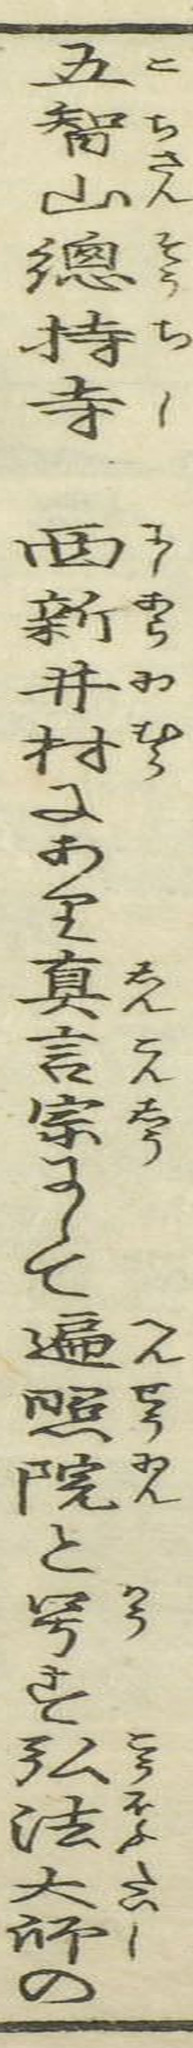五智山総持寺西新井村にあり真言宗にして遍照院と号す弘法大師の
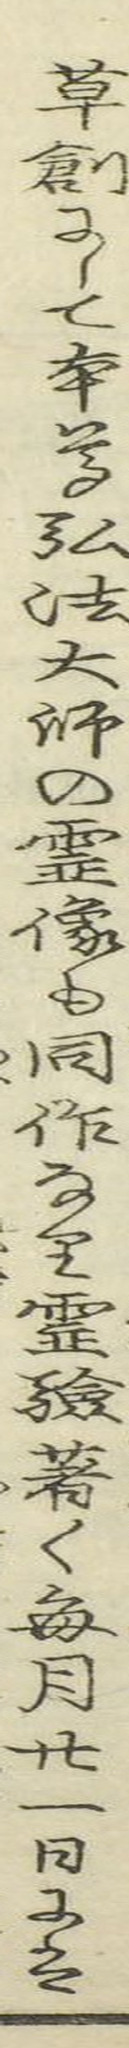草創にして本尊弘法大師の霊像も同作なり霊験著く毎月廿一日には
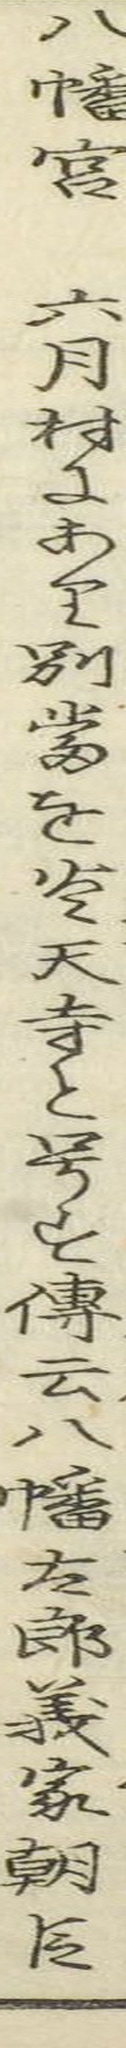八幡宮六月村にあり別当を炎天寺と号す伝云八幡太郎義家朝臣
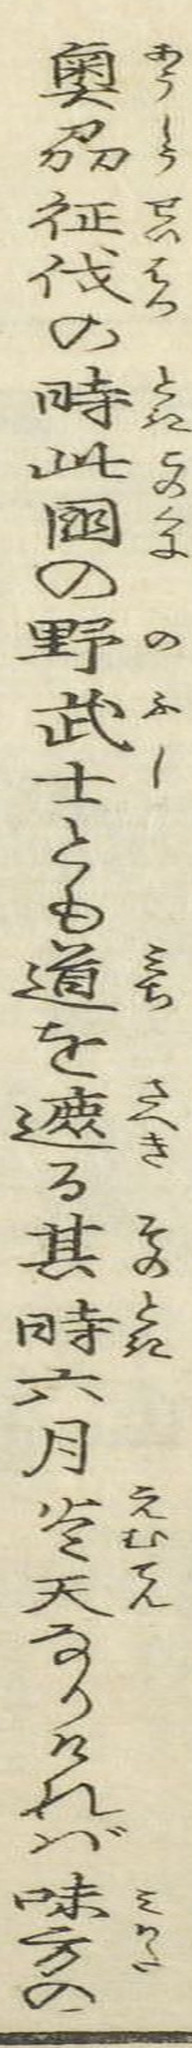奥州征伐の時此国の野武士とも道を遮る其時六月炎天なりければ味方の
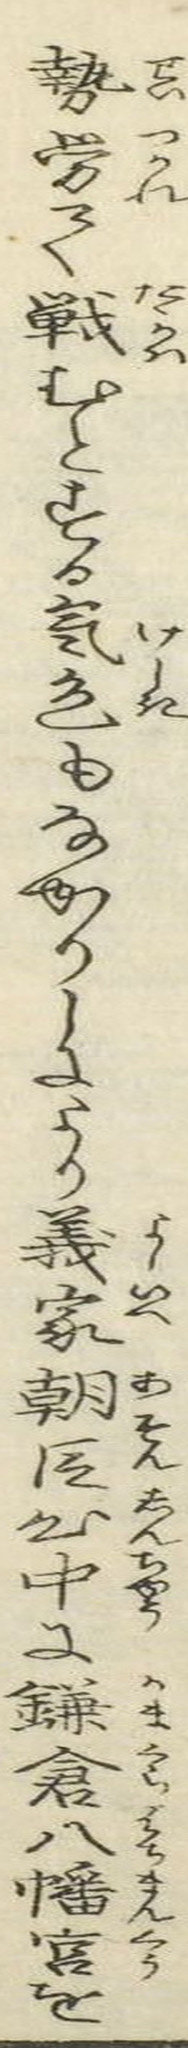勢労て戦むとする気色もなかりしにより義家朝臣心中に鎌倉八幡宮を
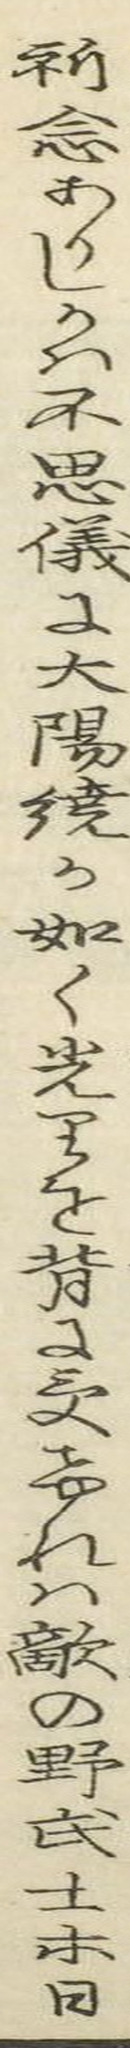祈念ありしかは不思儀に大陽繞か如く光りを背に受けれは敵の野武士等日
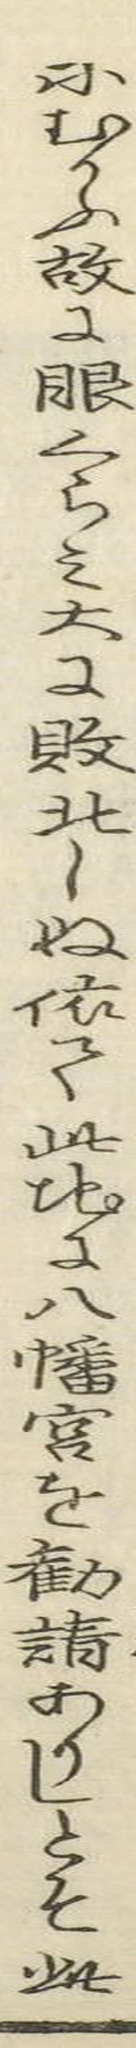にむかふ故に眼くらみ大に敗北しぬ依て此地に八幡宮を勧請ありしとそ此
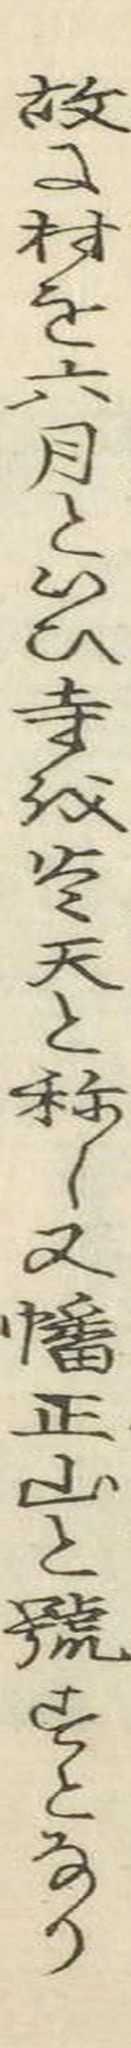故に村を六月といひ寺を炎天と称し又幡正山と号すとなり
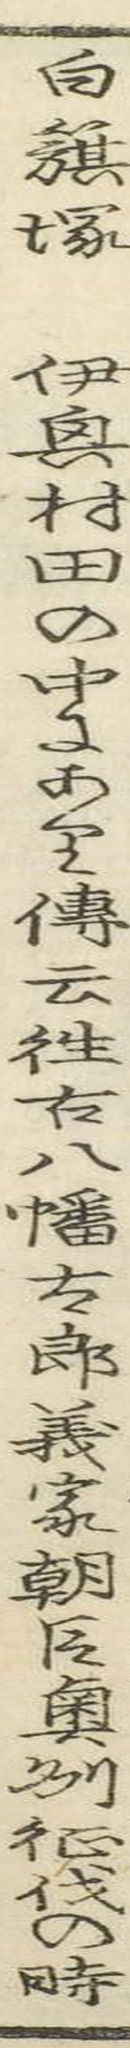白籏塚伊興村田の中にあり伝云往古八幡太郎義家朝臣奥州征伐の時
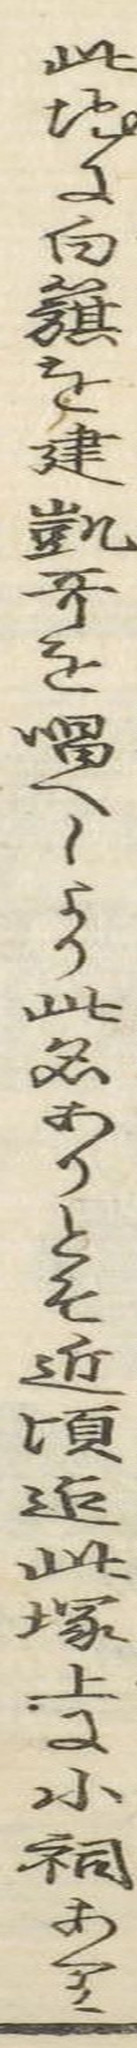此地に白籏を建凱哥を唱へしより此名ありとそ近頃迄此塚上に小祠あり
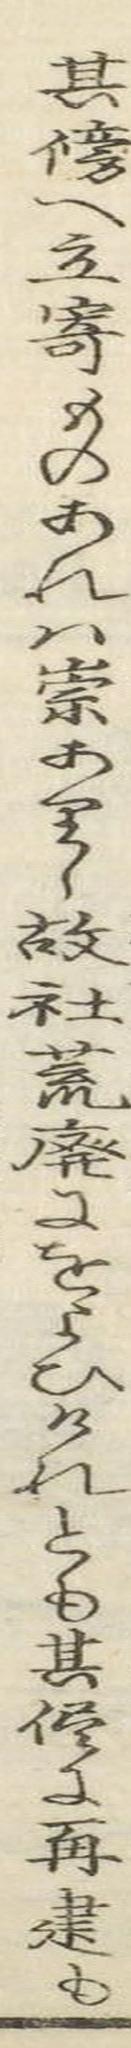其傍へ立寄ものあれは崇ありし故社荒廃にをよひけれとも其侭に再建も
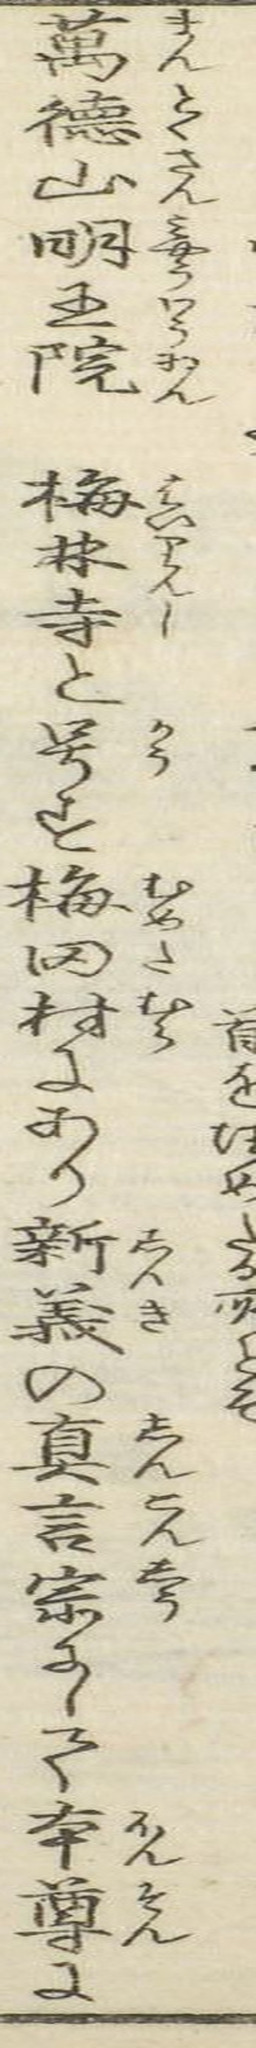萬徳山明王院梅林寺と号す梅田村にあり新義の真言宗にして本尊に
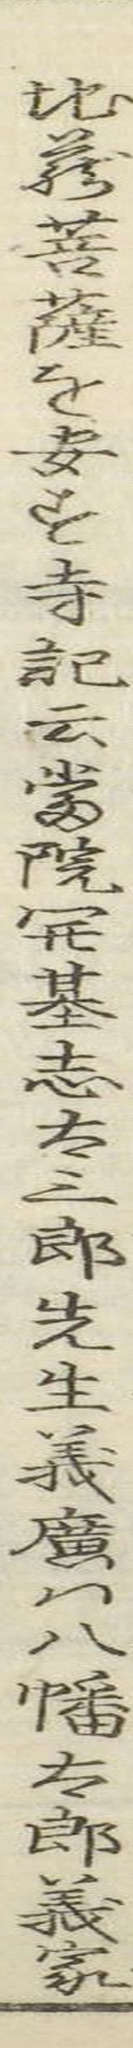地蔵菩薩を安す寺記云当院開基志太三郎先生義広は八幡太郎義家
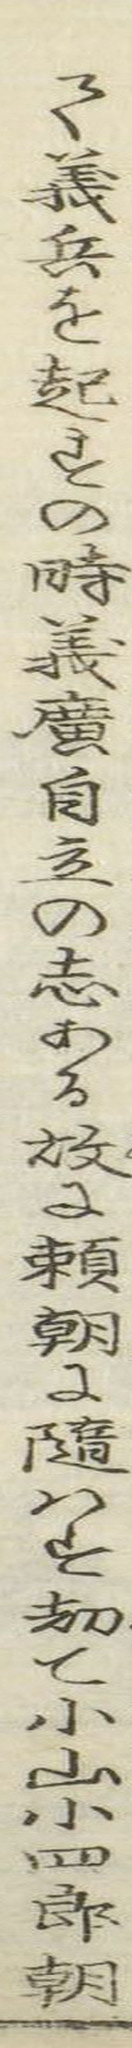て義兵を起すの時義広自立の志ある故に頼朝に随はす却て小山小四郎朝
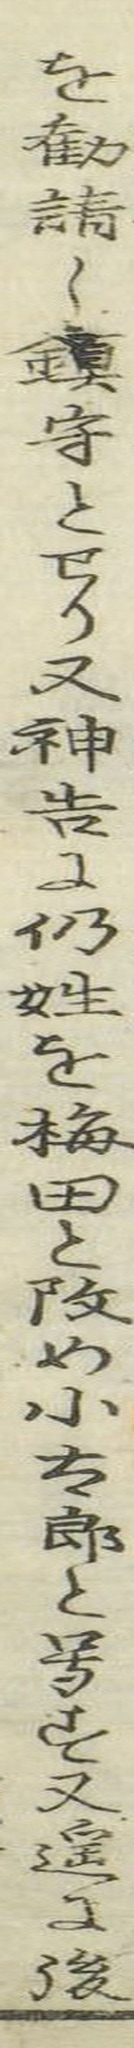を勧請し鎮守とせり又神告に仍姓を梅田と改め小太郎と号す又遥に後
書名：江戸名所図会 20巻 巻之17
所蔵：東京学芸大学教育コンテンツアーカイブ
